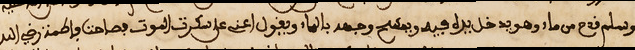وسلم قدح من ماء وهو يدخل يده فيه يمسح وحهه بالماء ويقول اعنى على سكرت الموت فصاحت فاطمة رضي الله
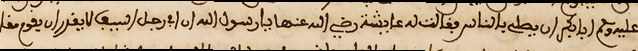عليه وسلم ابا بكر ان يسلى بالناس فقالت له عايشة رضي الله عنها يا رسول الله ان ابى رجل اسيف لايقدر ان يقوم مقا
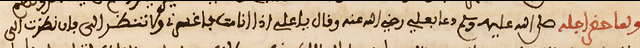ولما حضر اجله صلى الله عليه وسلم دعا بعلي رضي الله قال ياعلى اذا انا مت فاغسرنى ولاتنظر الى فان نظرت الى
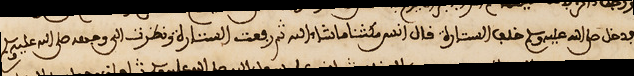فدخل صلى الله عليه وسلم خلف الستارة قال انس فمكثنا ما شاء الله ثم رفعت الستارة ونظرت الى وجه صلى الله عليه وسلم
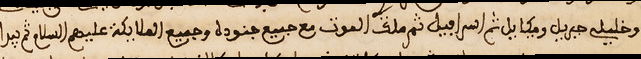وخليلى جبريل ومكايل ثم اسرافيل ثم ملك الموت مع جميع جنوده وجميع الملايكة علبهم السلام ثم يبدا
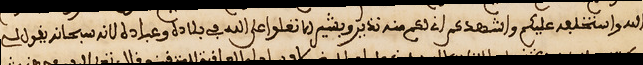الله واستخلفه عليكم واشهدكم ابى لكم منه نذير وبشير الا تعلوا على الله في بلاده وعباد لانه سبحانه يقول لى
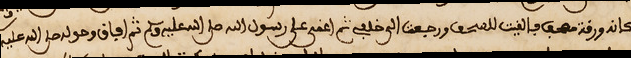كانه ورقة مصحف فالقيت للسحف ورجعت الى خلفى ثم اغمى على رسول الله صلى الله عليه وسلم ثم افاق وحوله صلى الله عليه
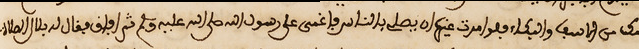مك من الاسف والبكاء فلو امرت غيره ان يصلى بالناس فاغمى على رسول الله صلى الله عليه وسلم ثم افاق فقال له بلال الصلاة
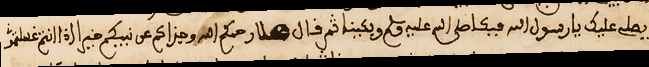يصلى عليك يا رسول الله فبكا صلى الله عليه وسلم وبكينا ثم قال محلا رحمكم الله جزاكم عن نبيكم خيرا اذا انتم غسلتمونى
